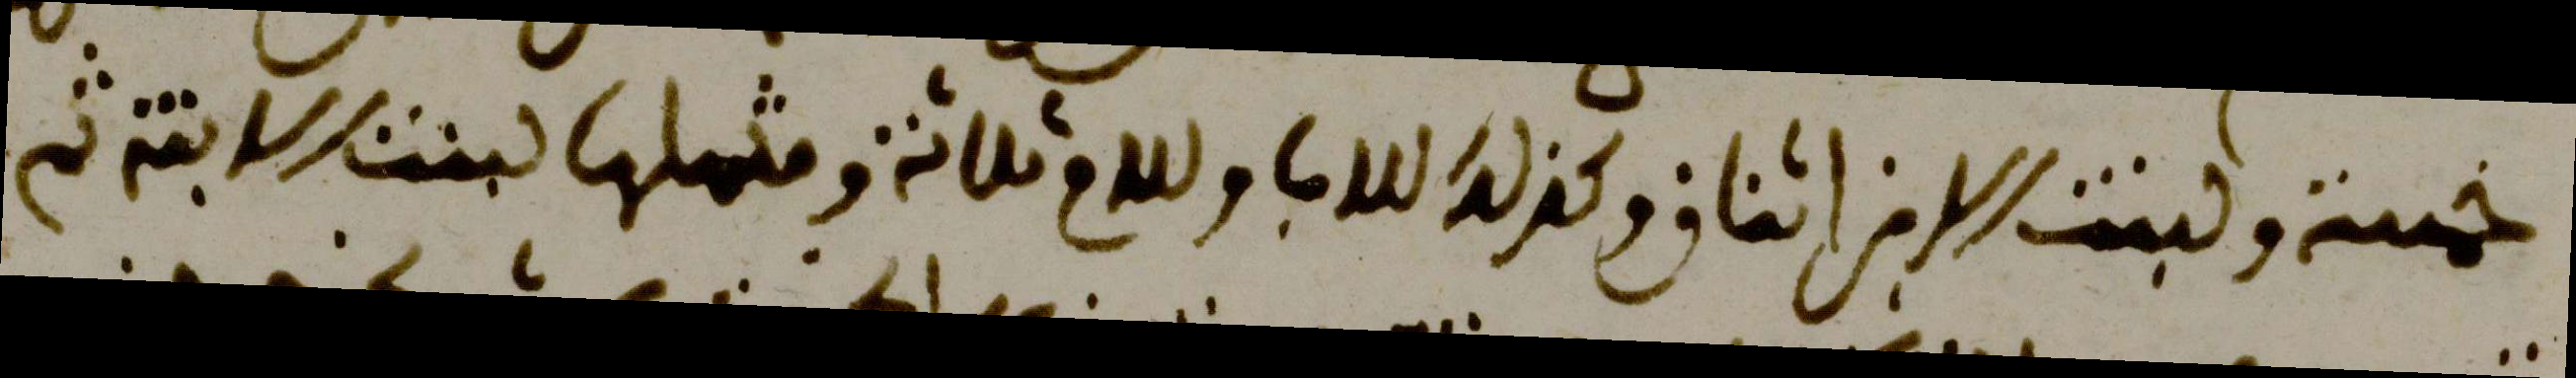خمسة ولبنت الابن اثنان وكذلك للاب وللام ثلاثة ومثلها لبنت الابنة ثم
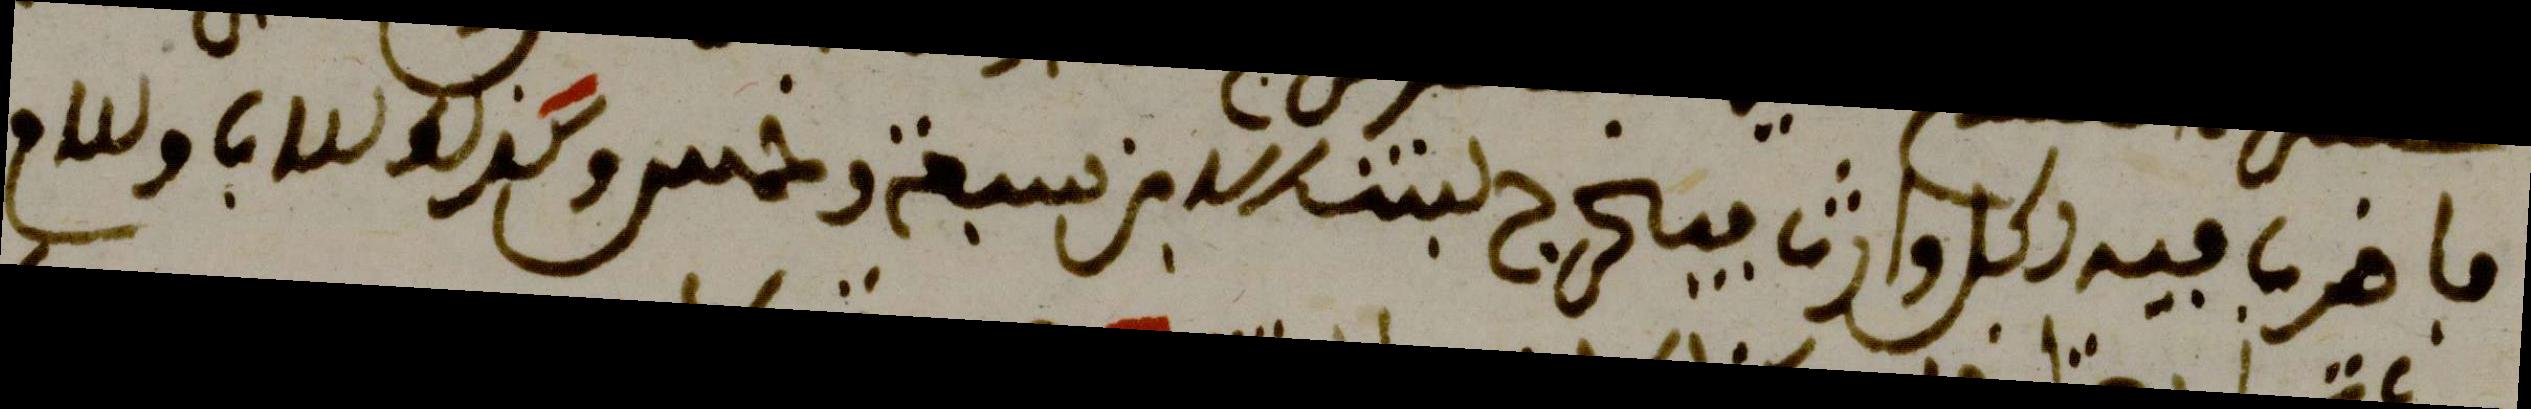فاضرب فيه لكل وارث فيخرج لبنت الابن سبعة وخمس وكَذلك للاب وللام
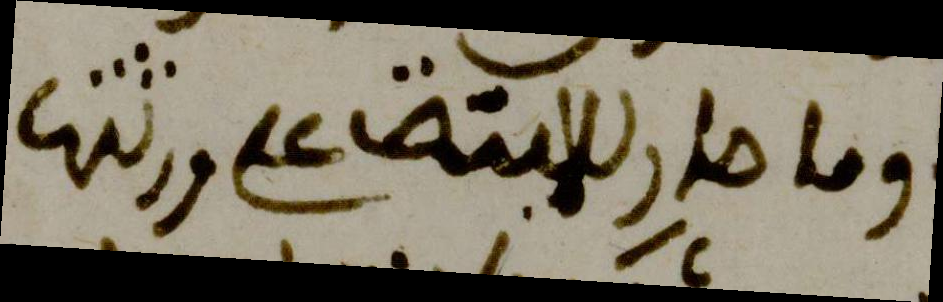وما صار للابنت على ورثتها
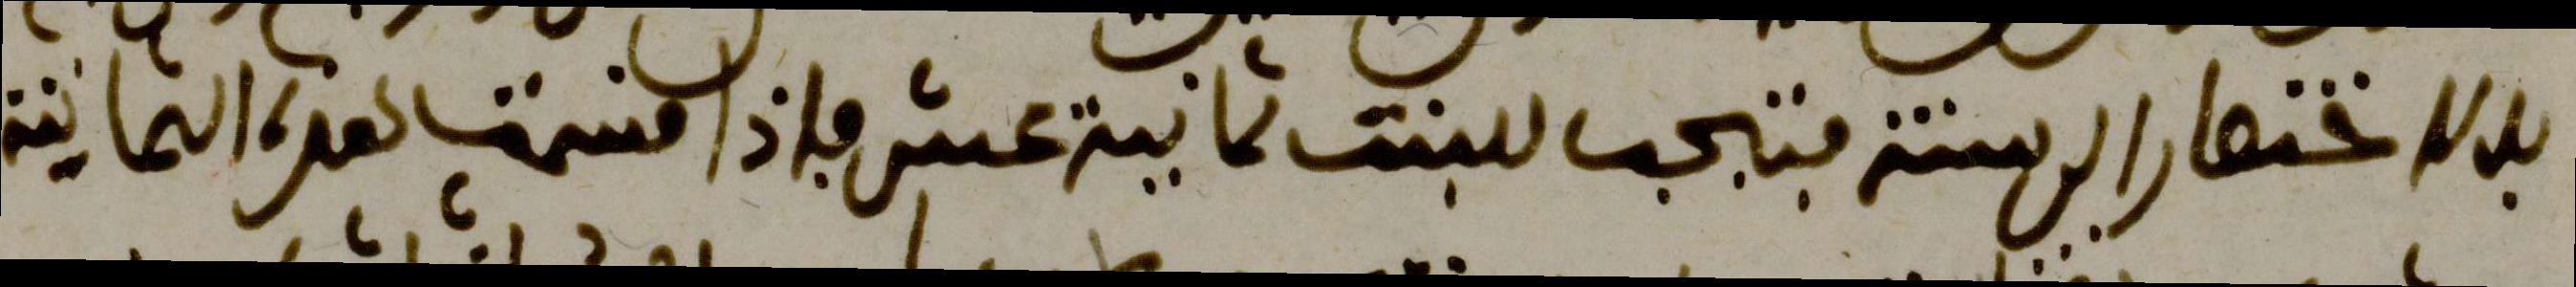بالاختصار الى ستة فيجب للبنت ثمانية عشر فاذا قسمت هذه الثمانية
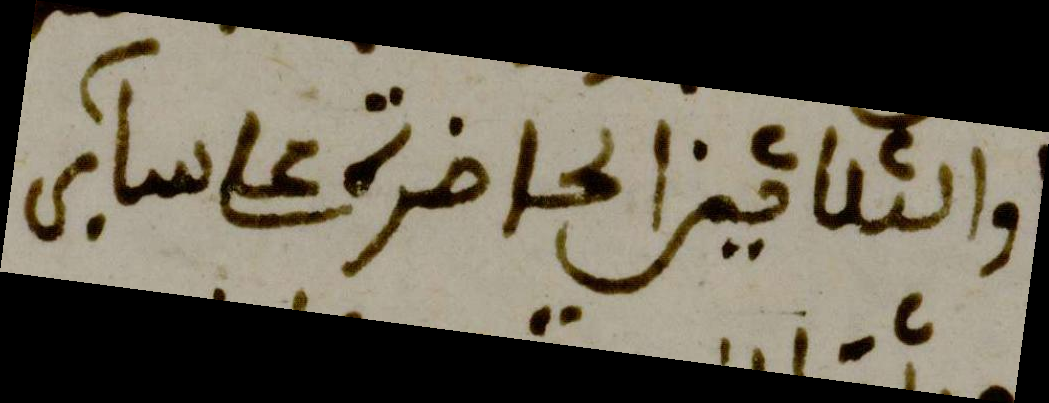والثلاثين الحاضرة على سائر
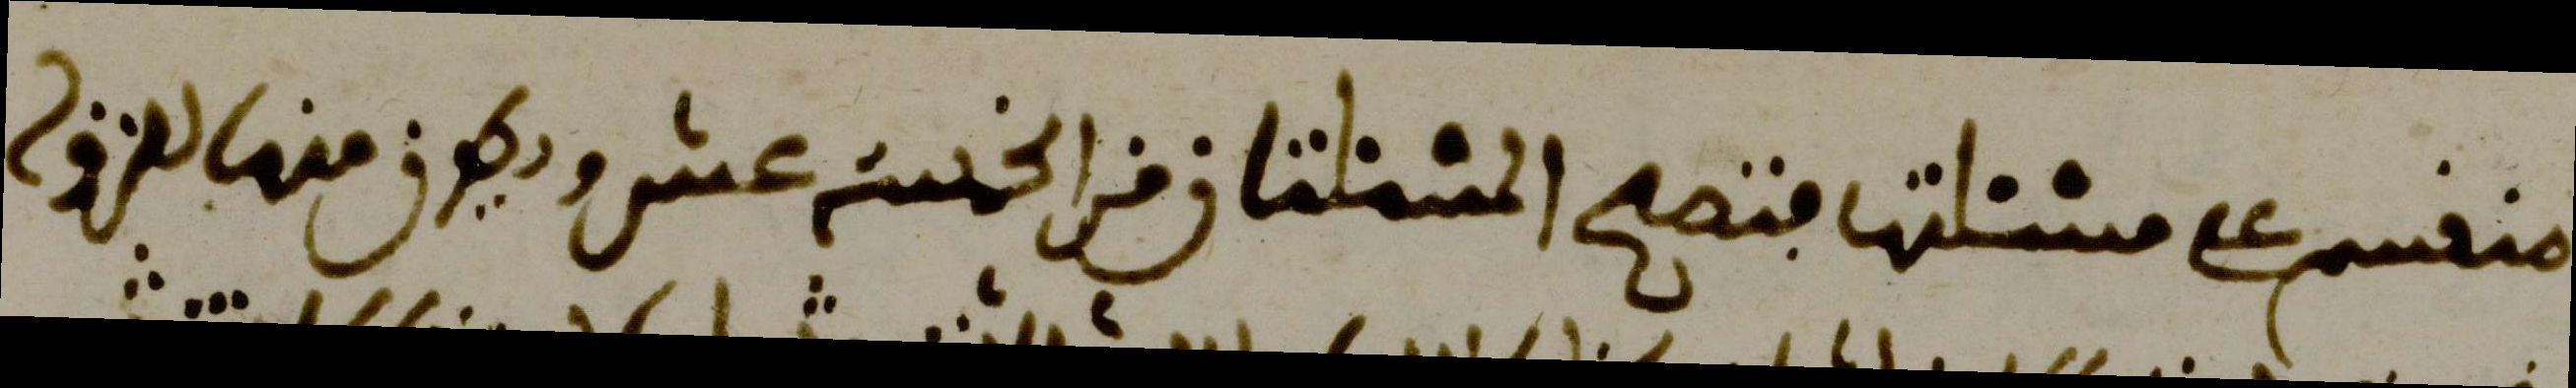منقسم على مسْئلتها فتصح المسْئلتان من الخمسة عشر ويكون منها للزوج
